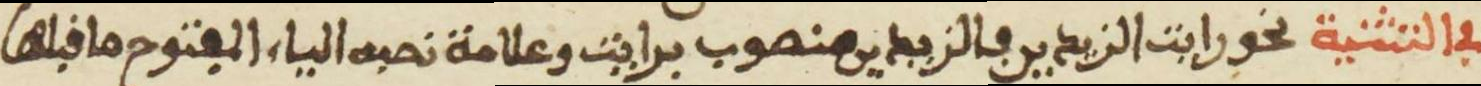في التثنية نحو رايت الزيدين فالزيدين منصوب برايت و علامة نصبه الياء المفتوح ما قبلها
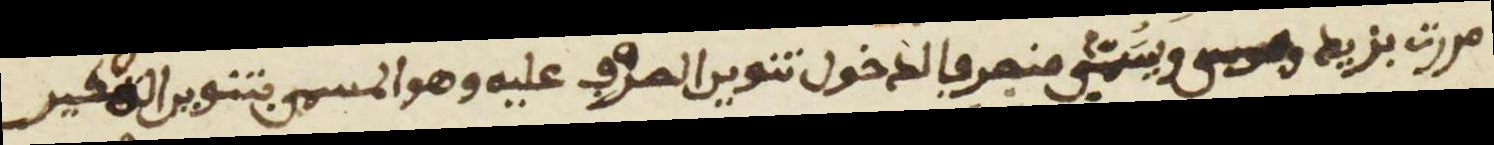مررت بزيد و موسى و يسمى منصرفا لدخول تنوين الصرف عليه و هو المسمى بتنوين التمكين
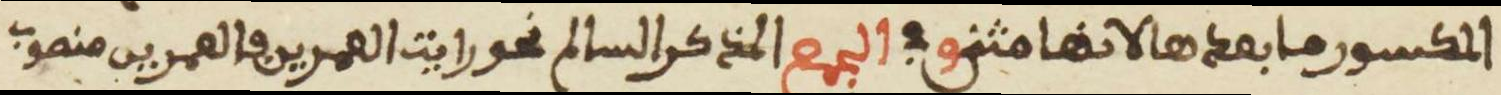المكسور مابعدها لانها متنى و في الجمع المذكر السالم نحو رايت العمرين فالعمرين منصوب
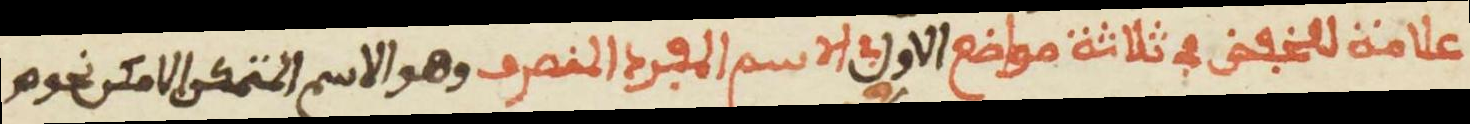علامة للخفض في ثلاثة مواضع الاول في الاسم المفرد المنصرف و هو الاسم المتمكن الامكن نحو م
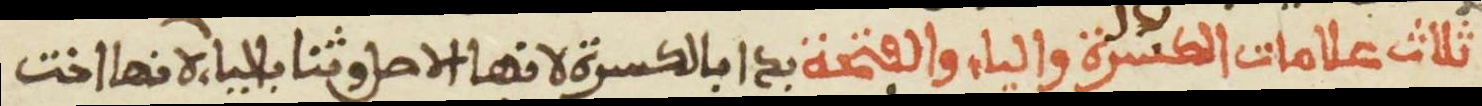ثلال علامات الكسرة و الياء و الفتحة بدا بالكسرة لانها الاصل و ثنا بالياء لانها اخت
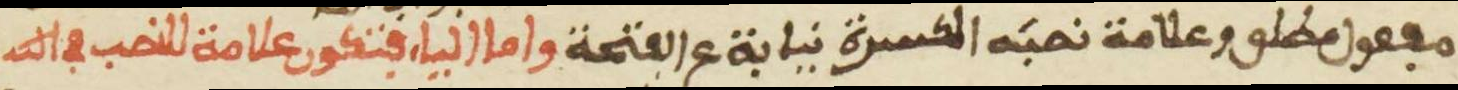مفعول مطلق و علامة نصبه الكسرة نيابة عن الفتحة و اما الياء ففتكون علامة للنصب في
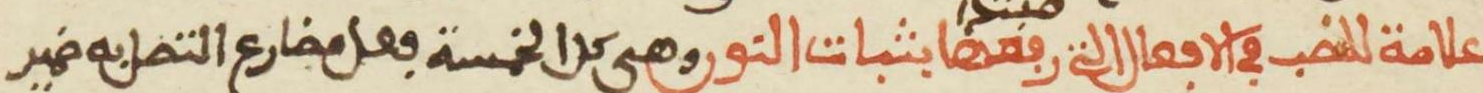علامة للنصب في الافعال التي رفعها بثبات النون و هي كل الخمسة فعل مضارع التصل به ضمير
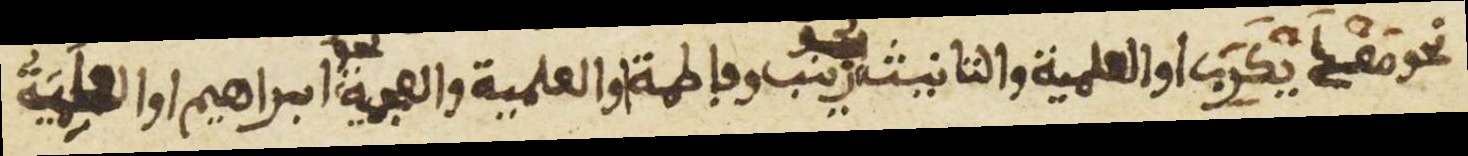نحو معديكرب او العلمية و التانيث زينب و فاطمة او العلمية و العجمية ابراهيم او العلمية
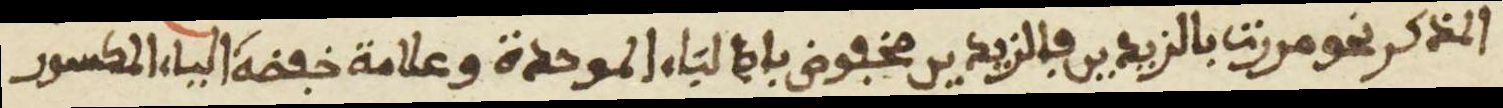المذكر نحو مررت بالزيدين فالزيدين مخفوض ب# لباء الموحدة و علامة خفضه الياء المكسور
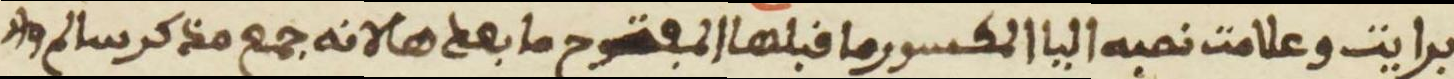برايت و علامة نصبه اليا المكسور ما قبلها المفتوح ما بعدها لانه جمع مذكر سالم
